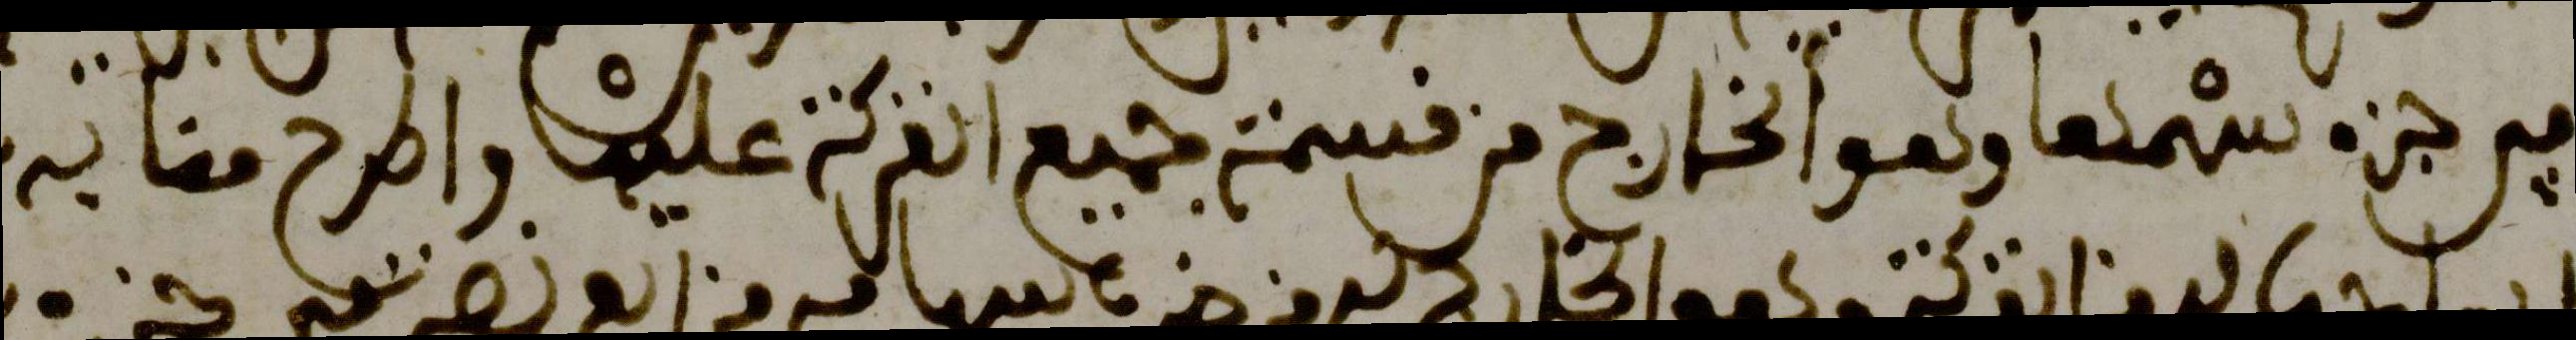في جزء سهْمها وهو الخارج من قسمة جميع التركة عليْها واطرح منابه
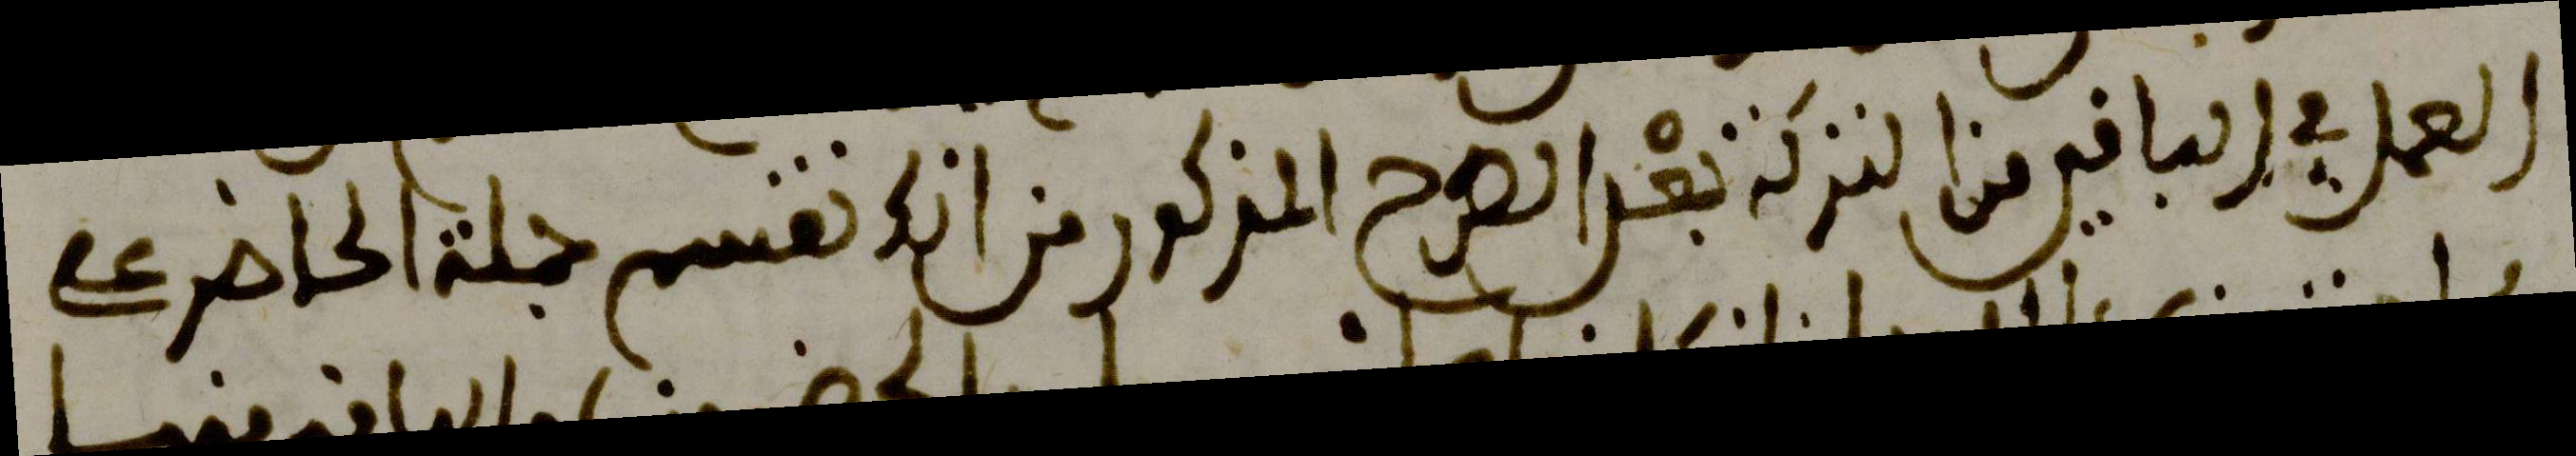العمل في الباقي من التركة بعْد الطرح المذكور من انك تقسم جملة الحاضر على
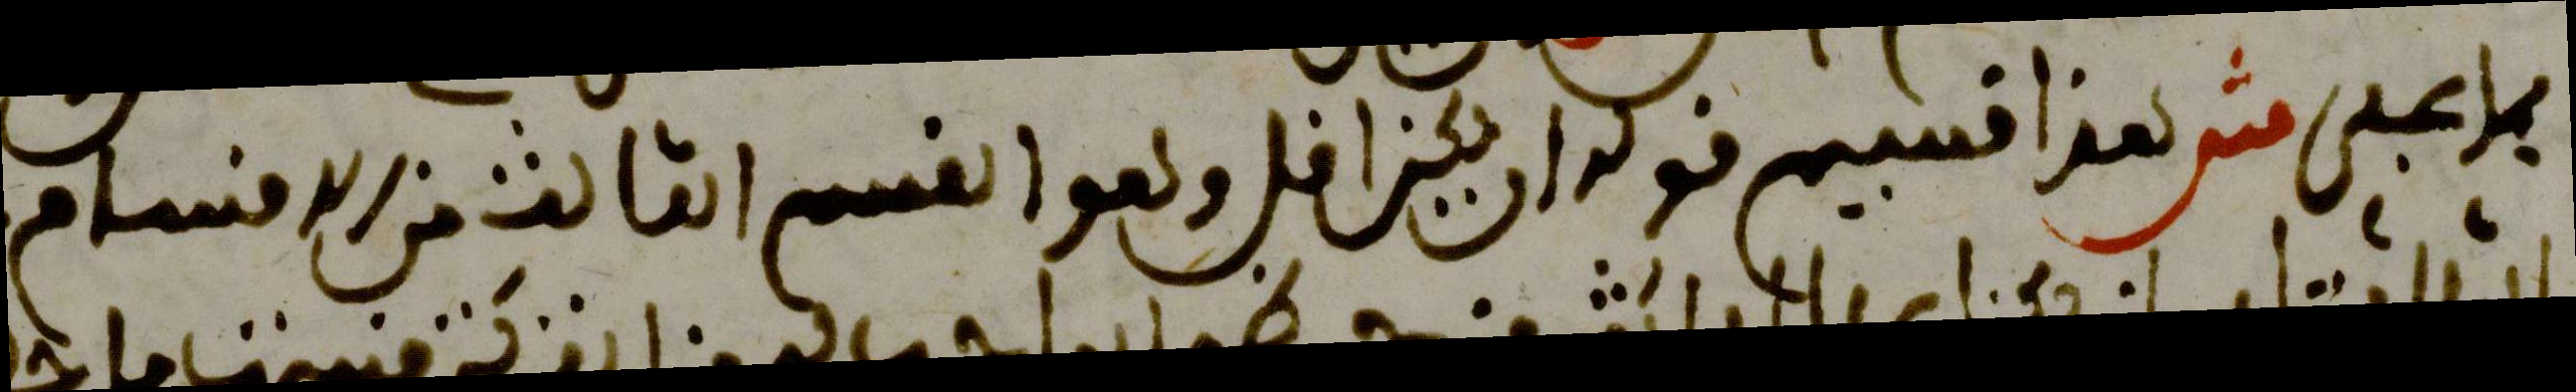بما غبر ش هذا قسيم قوله ان يكن اقل وهو القسم الثالث من الاقسام
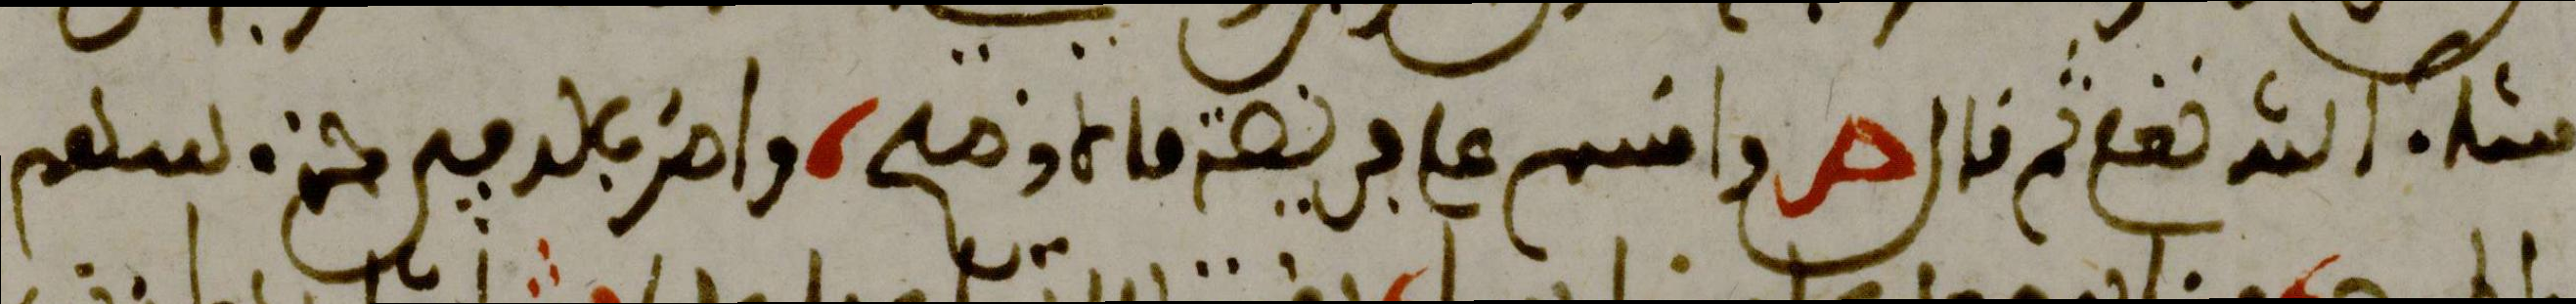شاء الله تعلى ثم قال ص واقسم على فريضة مالا وضح واضرب له في جزء سهم
